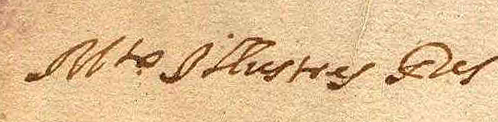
Mto Illustres sRes
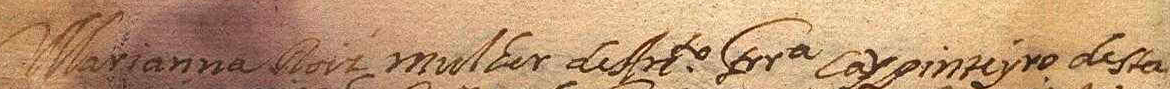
Marianna Roiz̄ mulher de An.to Frra caypinteyro desta
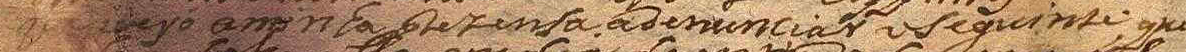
Va veyo a minha prezensa a denunciar o seguinte que
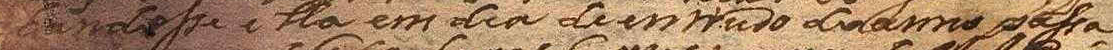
achandosse ella em dia de entrudo do anno passa
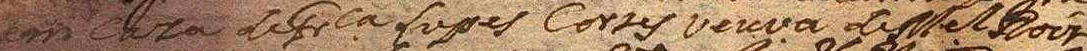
em Caza de Fr.ca Lopes Cortes veuva de Mel Roiz̄
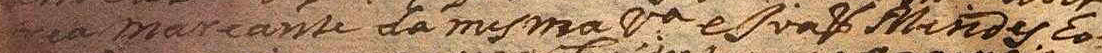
ia marcante da mesma V.a e Ioaõ Mindes, ho
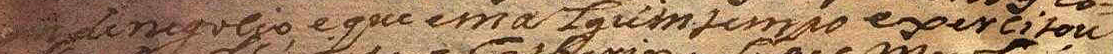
mem de negocio, e que em algum tempo exercitou
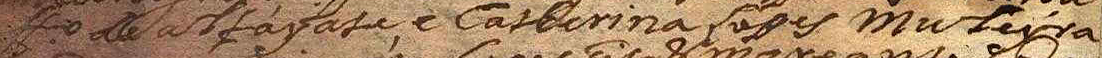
ff.o de alfayate, e Catherina Lopes muLeyra
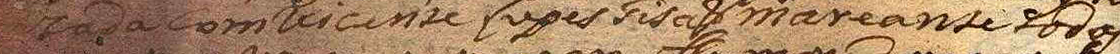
zada com vicente Lopes Tisaõ mareante todos
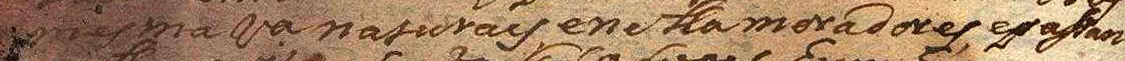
mesma va naturaes e nella moradores, e passan
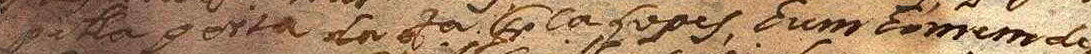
pella porta da d̄a Frc.a Lopes, hum homem de
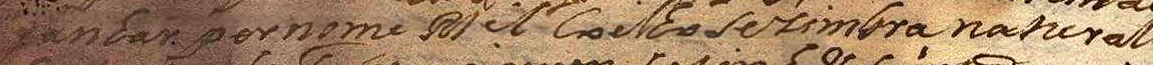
ganhar per nome M.el Coelho sezimbra, natural
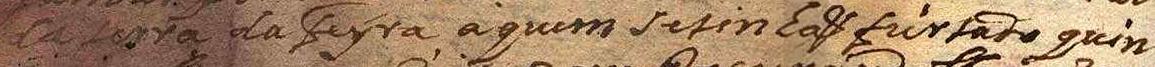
da terra da Feyra, a quem se tinhaõ furtado quin
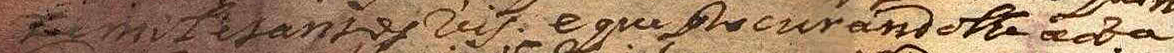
ze miL e tantos Reis; e que pRocurandolhe a d̄a
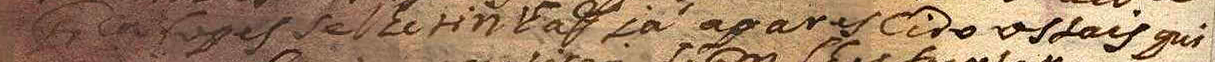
Fr.ca lopes se lhe tinhaõ iá aparescido os tais qui
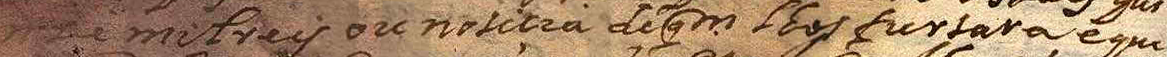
nze miL reis ou noticia de qm lhos furtara, e que
